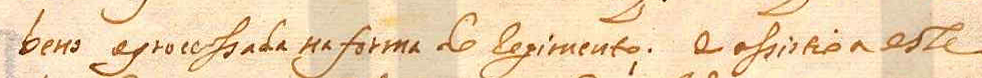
bens e processada na forma do Regimento; e assistio a este
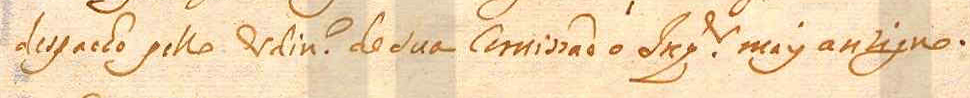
despacho pello ordin.ro de sua Comissaõ o Inq.or mais antiguo.
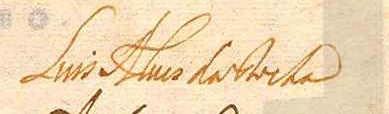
Luis Alues da Rocha
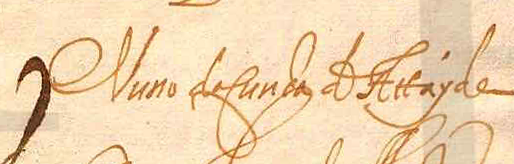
Nuno de Cunha d̄ Attayde
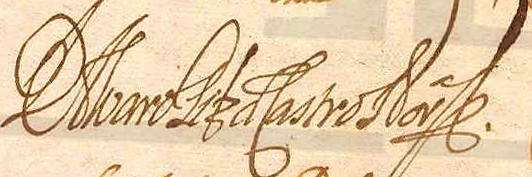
Alvaro Piz̄ d̄ Castro Nora
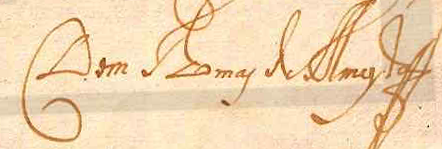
Dom Thomas de Almeyda
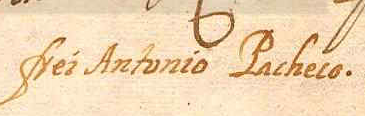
frei Antonio Pacheco.
